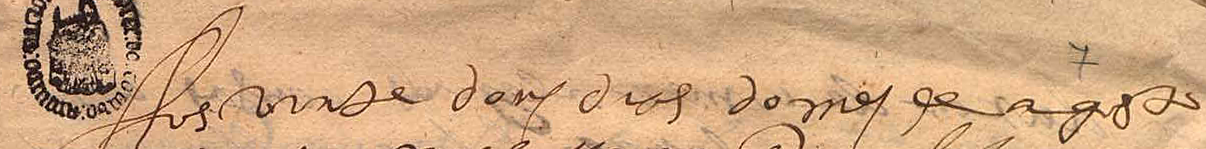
Aos vinte dous dias do mes de agosto
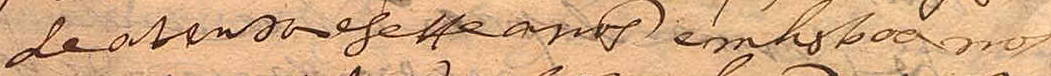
de oitenta e sette anōs em lisboa nos
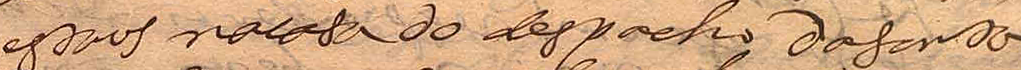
estaos na casa do despacho da santa
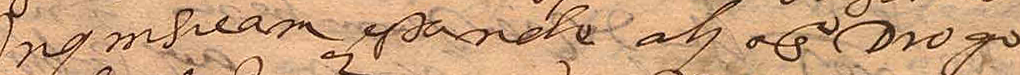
Jnquisicam estando alj o sr Diogo
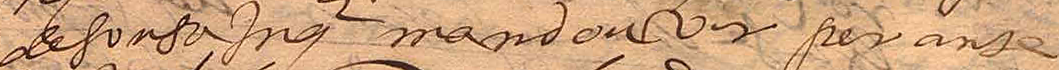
de sousa Jnqor mandou vir perante
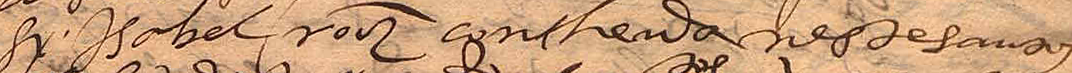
sy Jsabel rōiz contheuda nestes autos
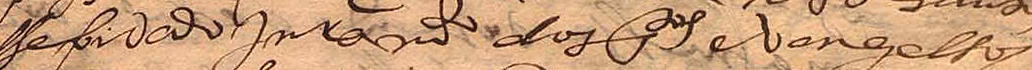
lhe foi dado Juramto dos stos evangelhos
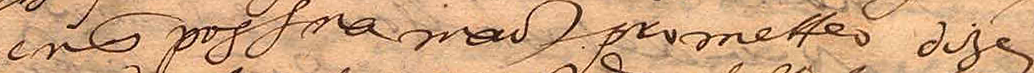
en q̄ pos sua maõ prometteo dizer
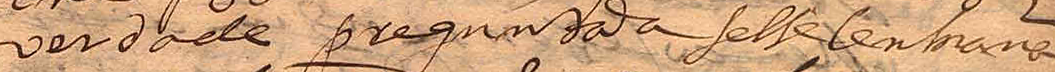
verdade preguntada se lhe lembraua
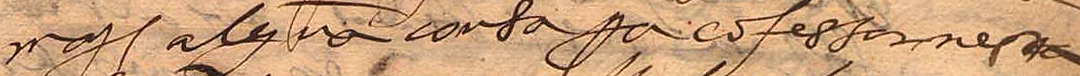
majs algūa cousa ꝑa cofessar nesta
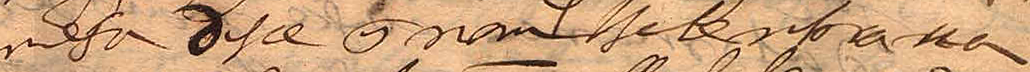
mesa disse q̄ nom lhe lembraua
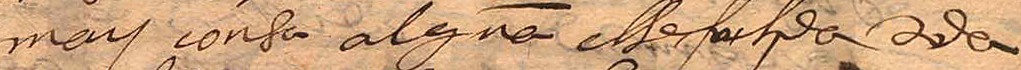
mais cousa algūa e lhe foi ljda toda
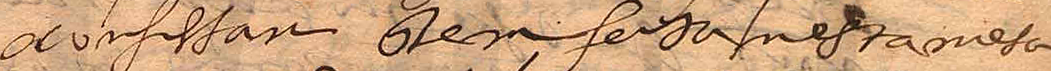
a confissam q̄ tem feita nesta mesa
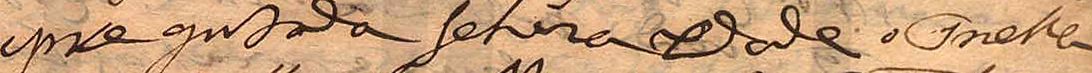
e pregutada se hera ꝟdade o q̄ nella
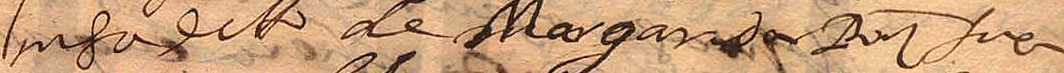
tinha ditto de Margarida Roīz sua
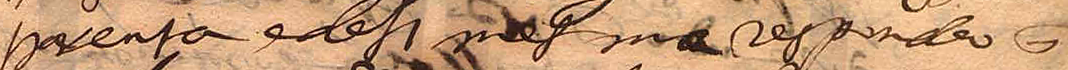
parenta e de si mesma respondeo q̄
